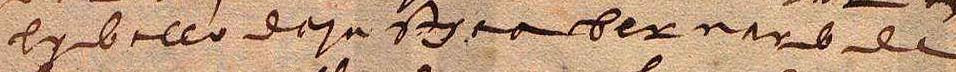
lybello da justyca bernardo de
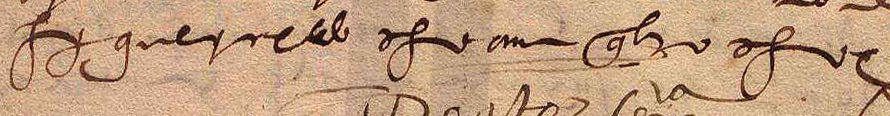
fygueyredo sꝑvam q̄ ho spvi
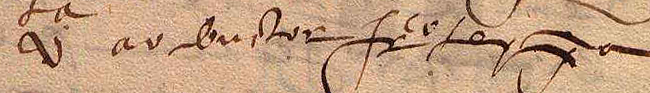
vta ao douctor frco teyxra
